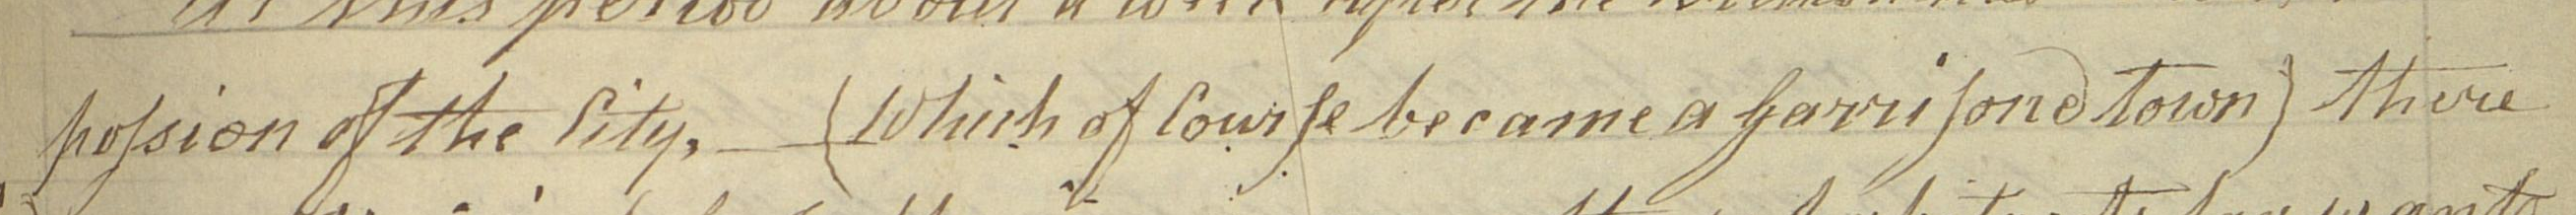possion of the City, (Which of Course became Garrisond town) there
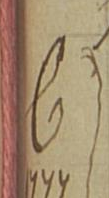C
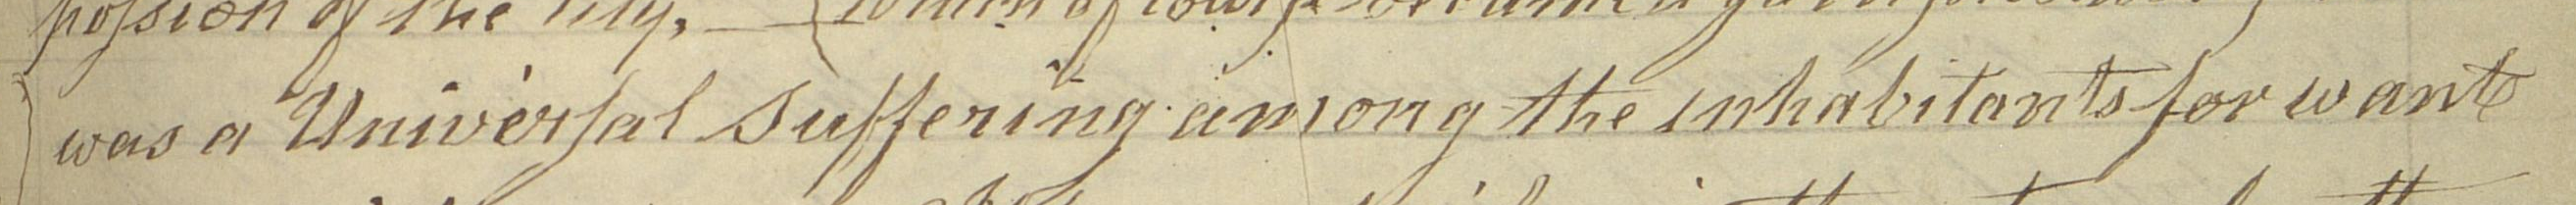was a Universal Suffering among the inhabitants for want
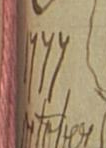1777
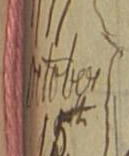October
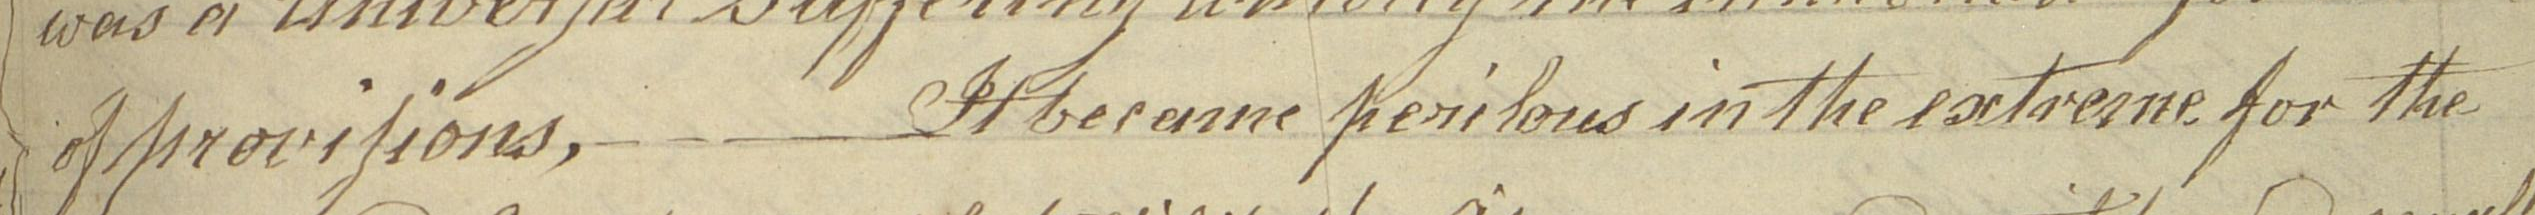of provisions. It became perilous in the extreme for the
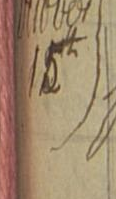15^th
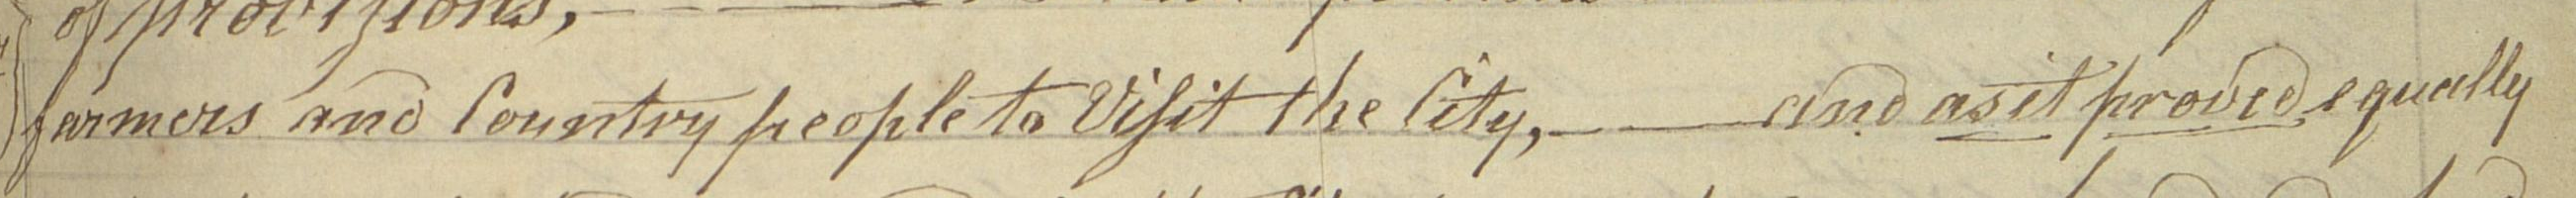farmers and Country people to Visit the City, and as it proved equally
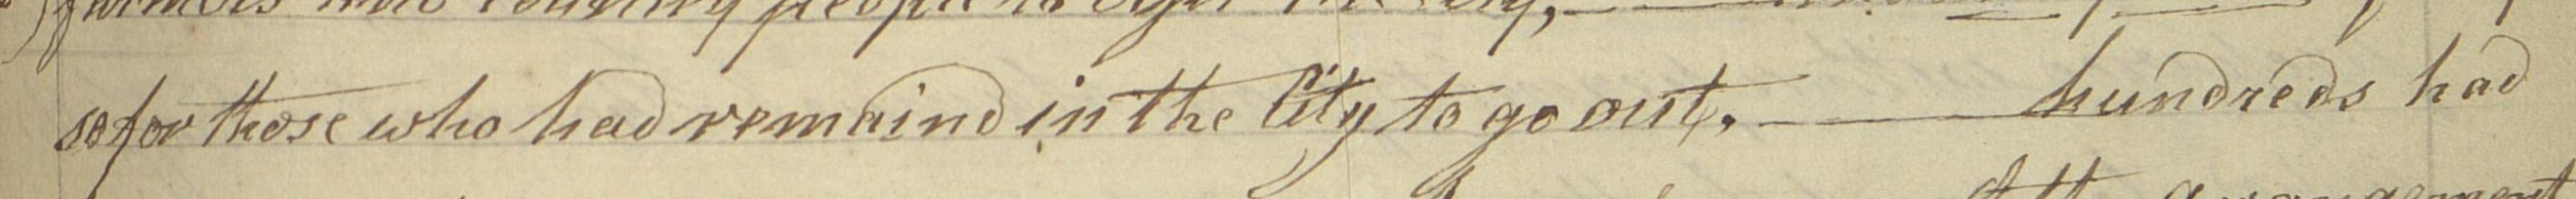so for those who had remaind in the City to go out, hundreds had
